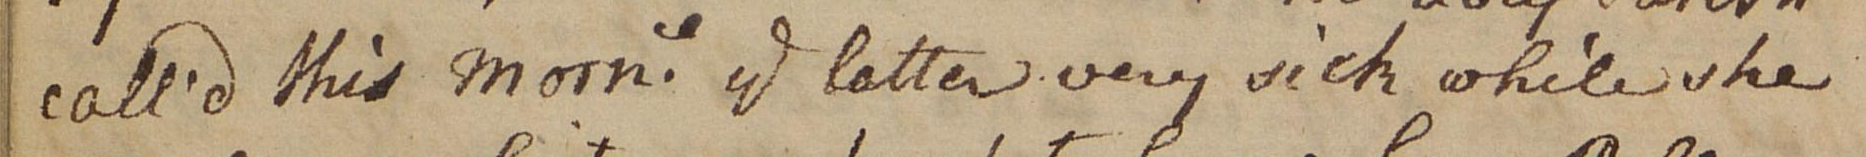call'd this morn^g. y^e latter very sick while she
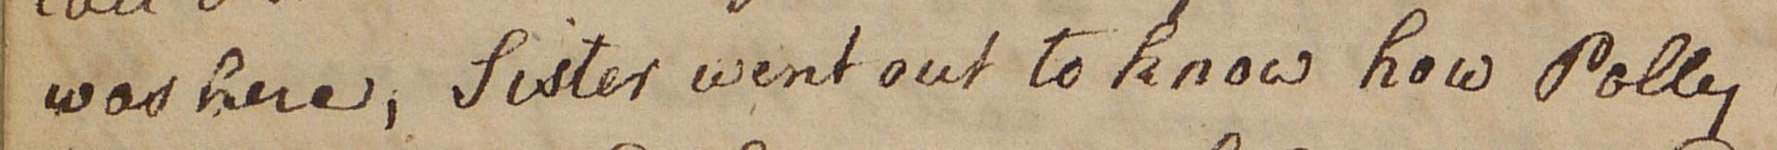was here, Sister went out to know how Polly
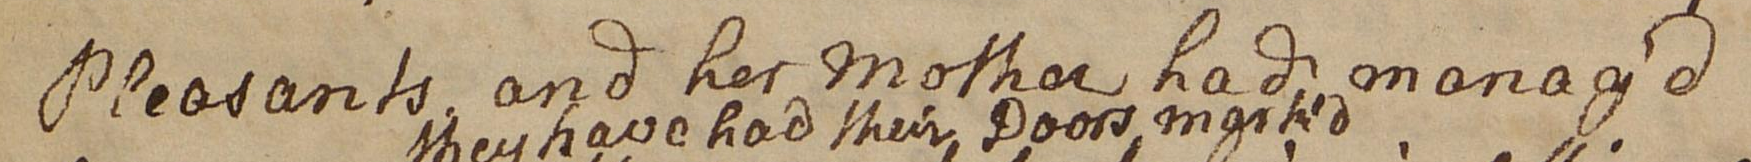Pleasants, and her mother had manag'd
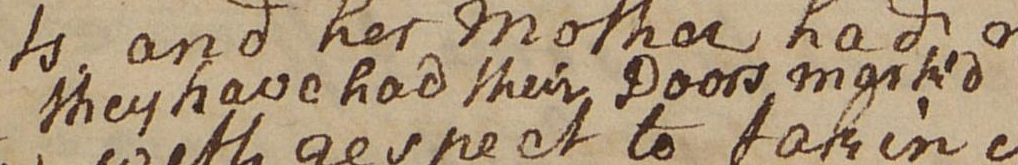they have had their Doors mark'd
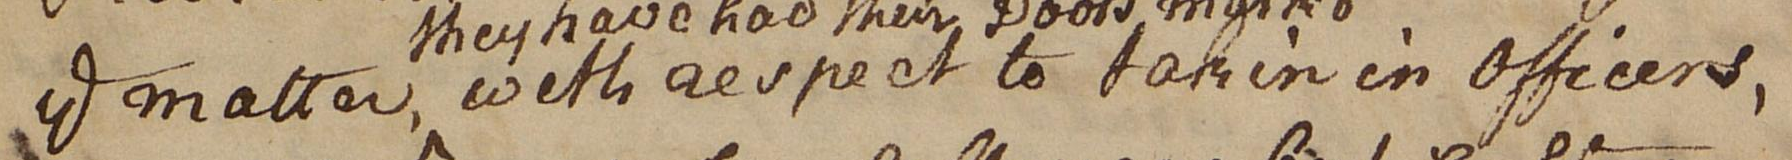y^e matter, ^ with respect to takin in Officers,
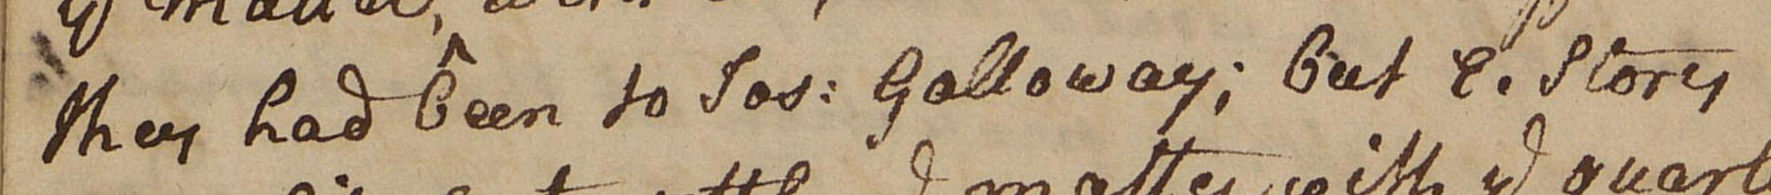they had been to Jos: Galloway; but E. Story
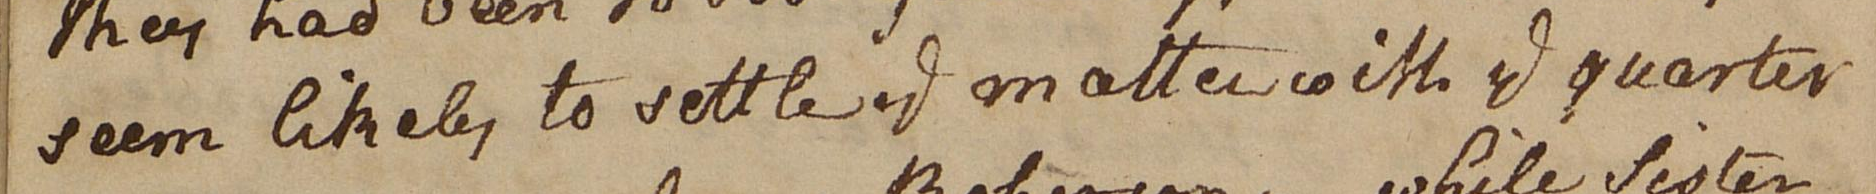seem likeley to settle y^e matter with y^e quarter
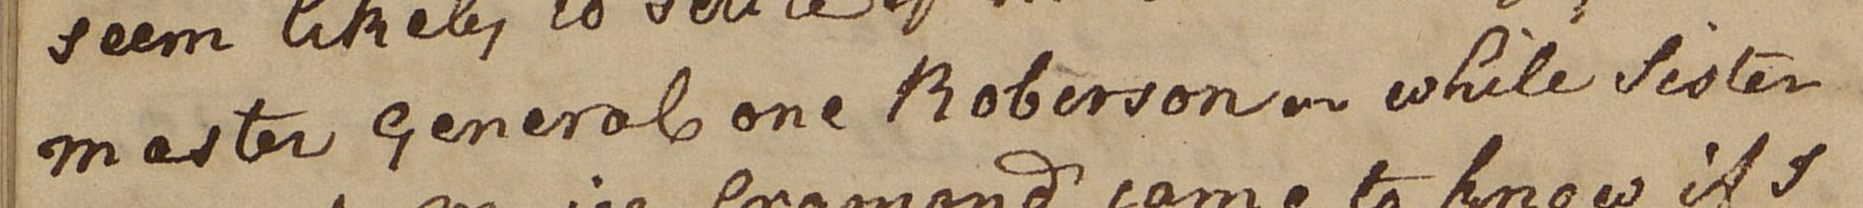Master General one Roberson on while Sister
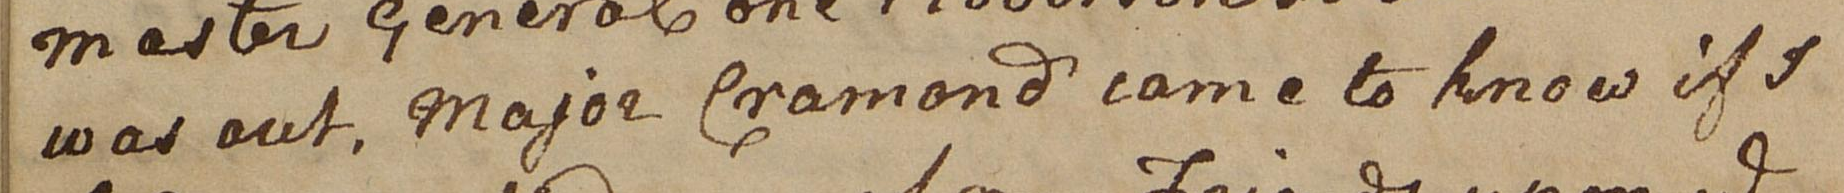was out, Major Cramond came to know if I
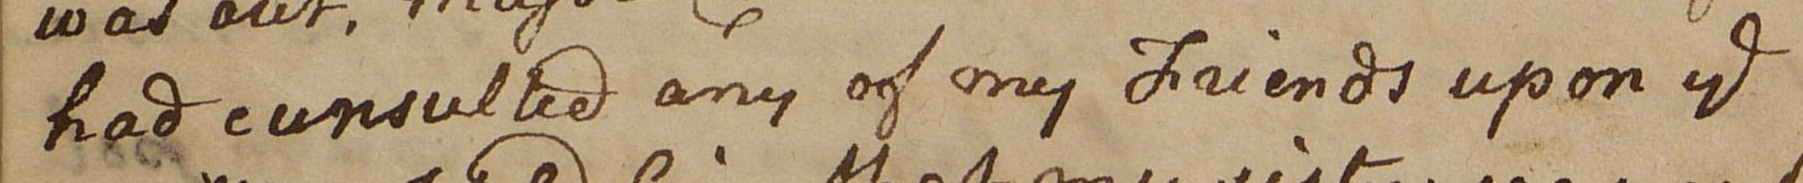had cunsulted any of my Friends upon y^e
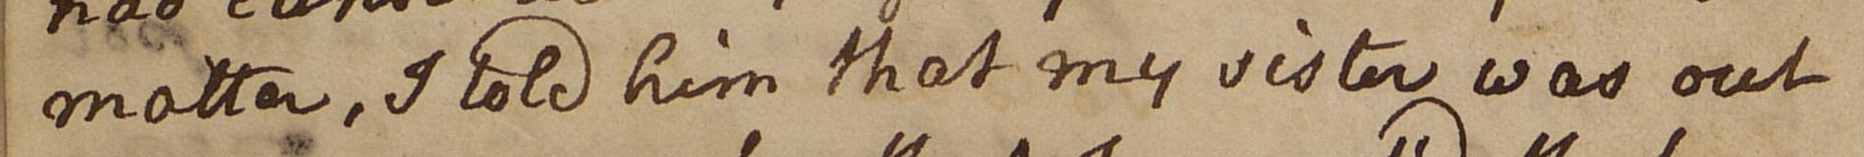matter, I told him that my sister was out
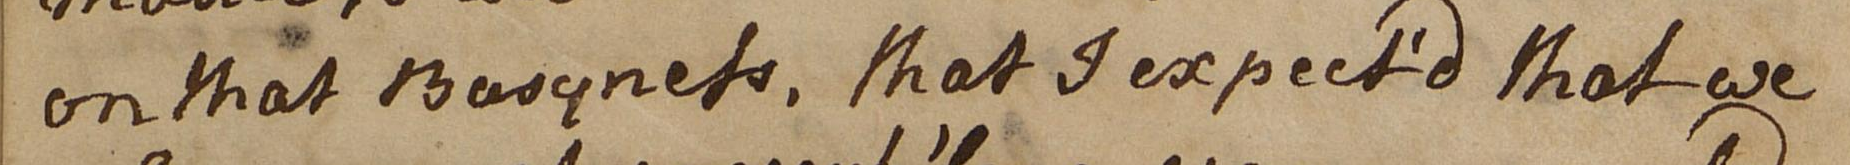on that Busyness, that I expect'd that we
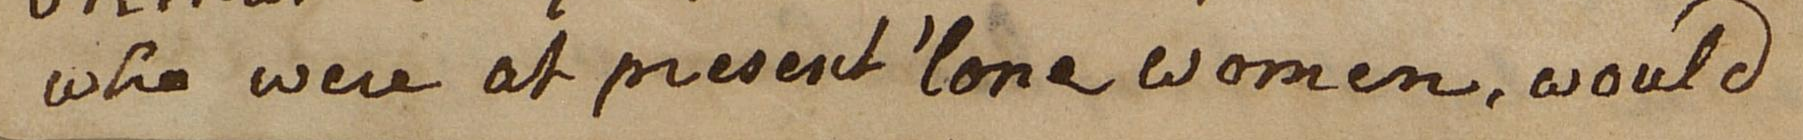who were at present 'lone women, would
